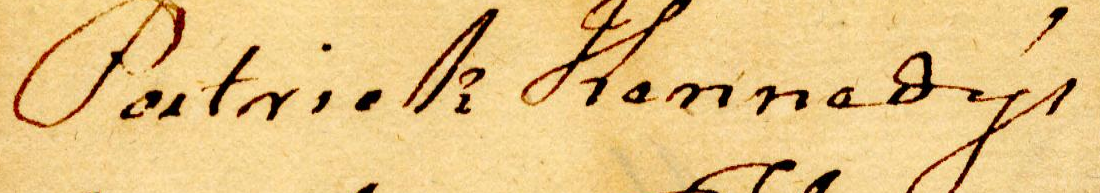Patrick Kennedy's
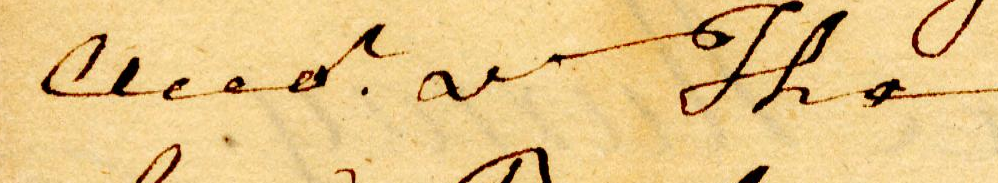Acco^t of The
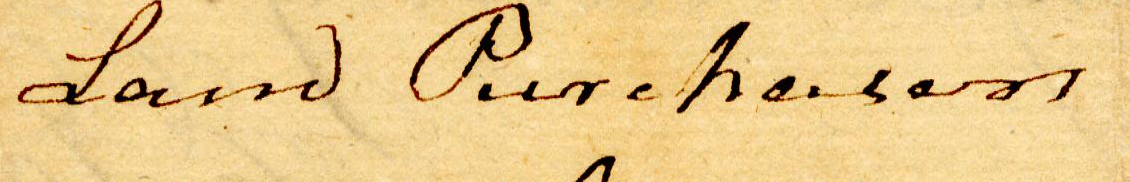Land Purchasers
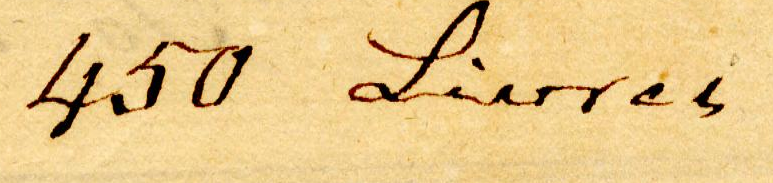450 Livres
